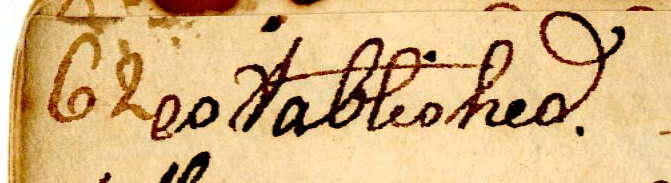62 established.
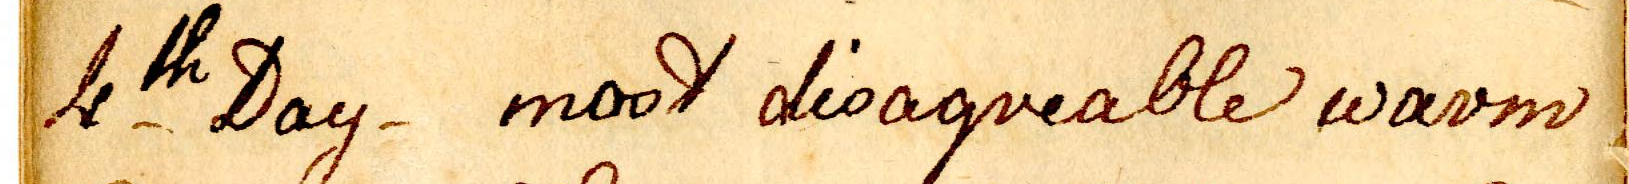4^th Day- most disagreable warm
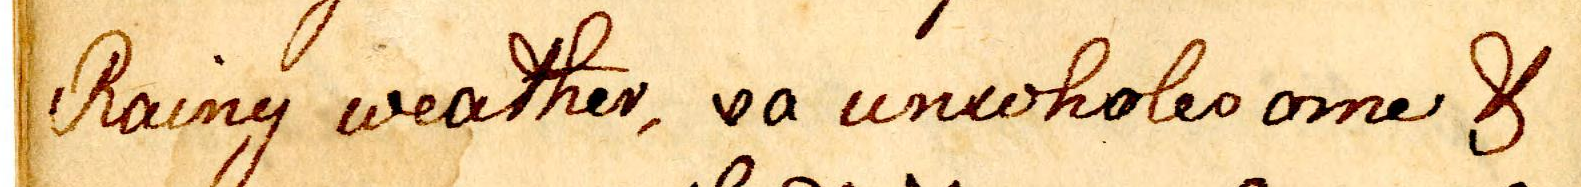Rainy weather, so unwholesome &
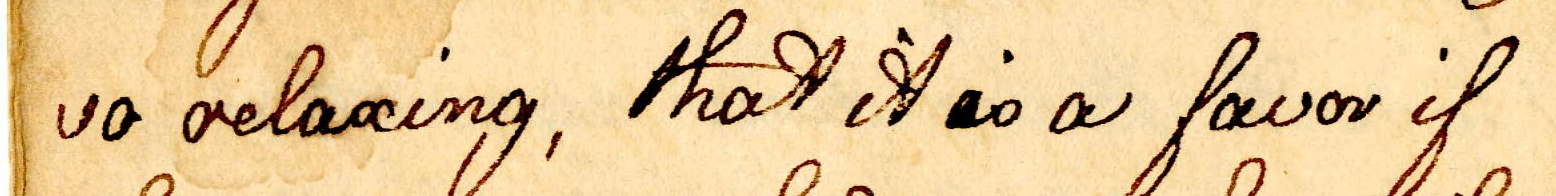so relaxing, that it is a favor if
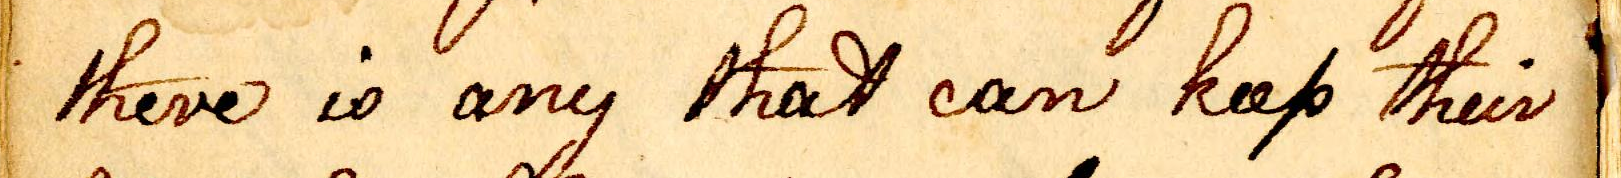there is any that can keep their
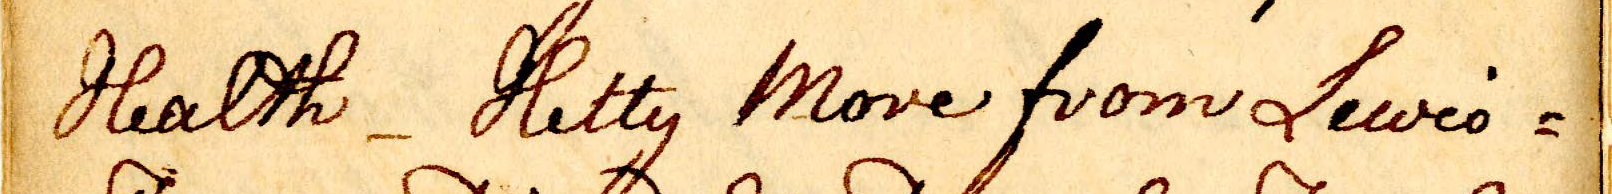Health- Hetty More from Lewis-
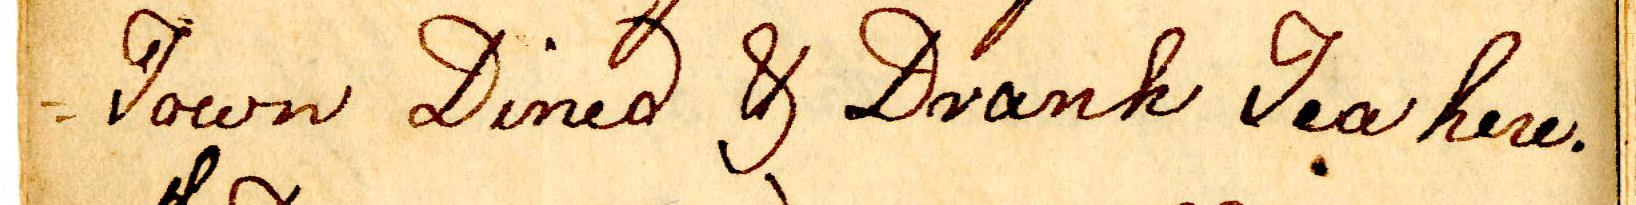-Town Dined & Drank Tea here.
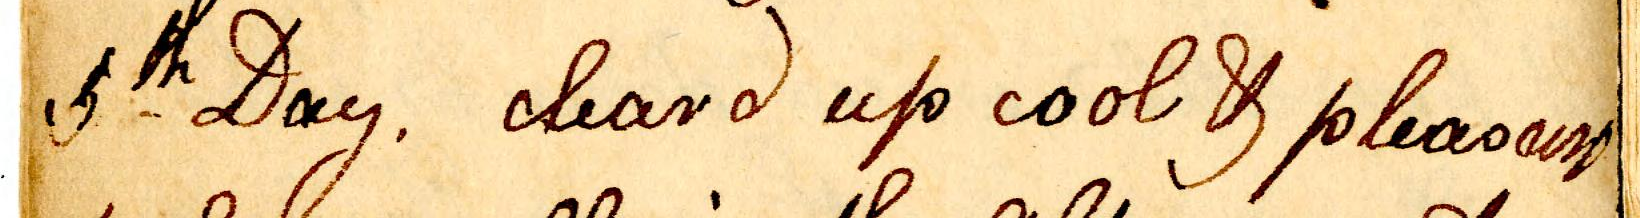5^th Day, cleard up cool & pleasan
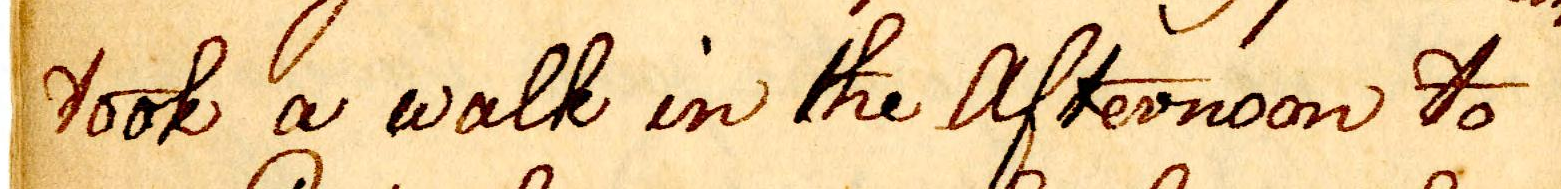took a walk in the Afternoon to
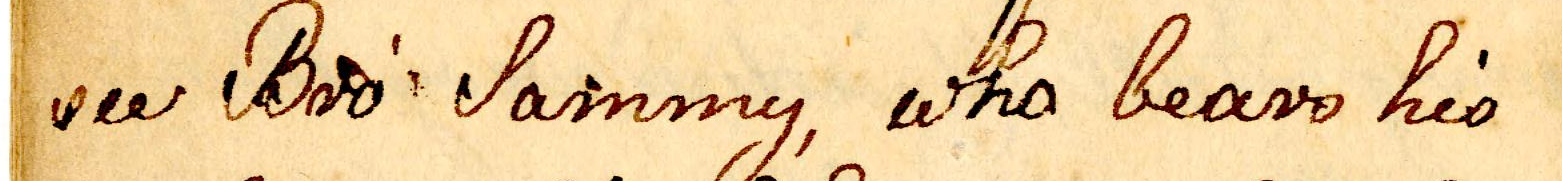see Bro' Sammy, who bears his
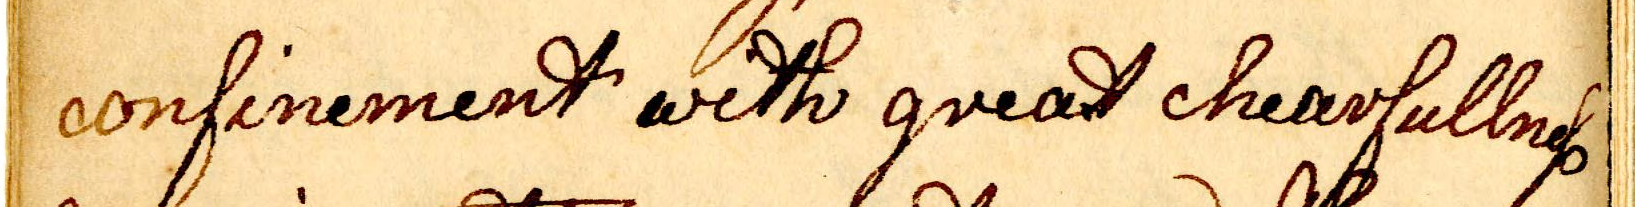confinement with great chearfullness
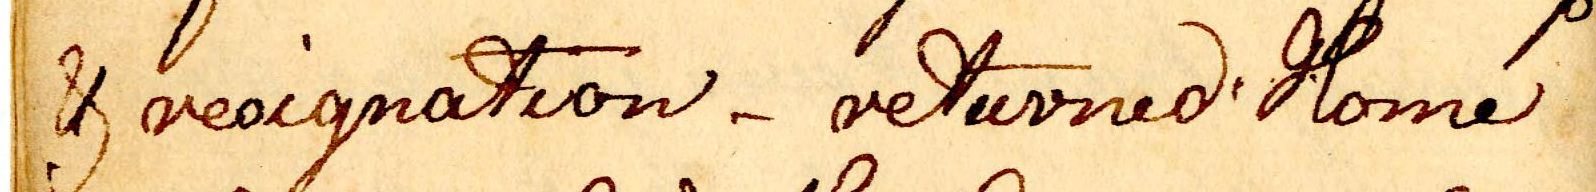& resignation- returned Home
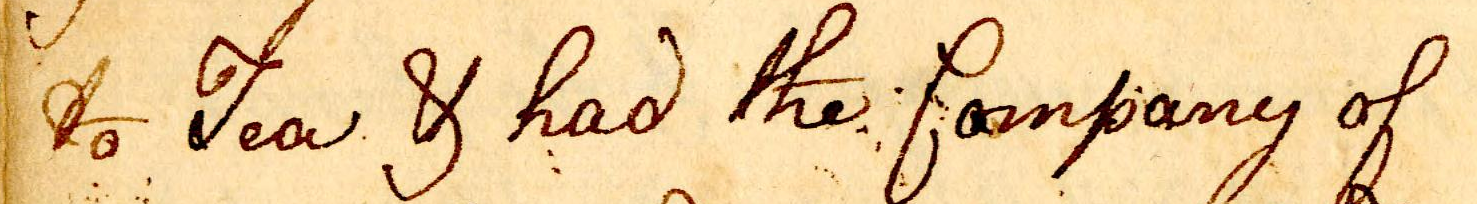to Tea & had the Company of
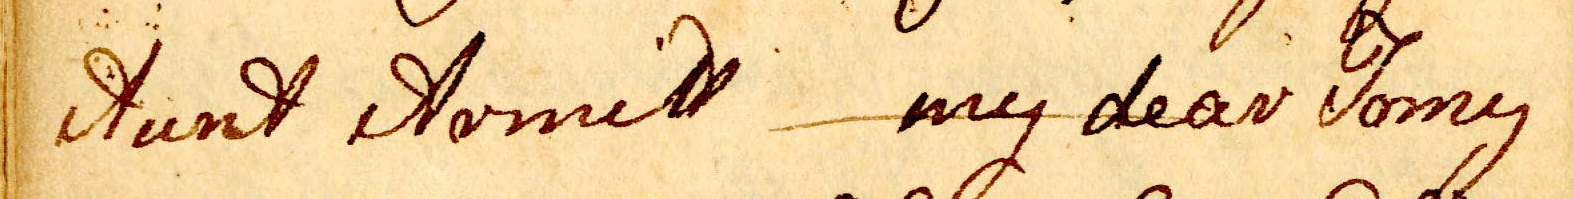Aunt Armitt my dear Tomy
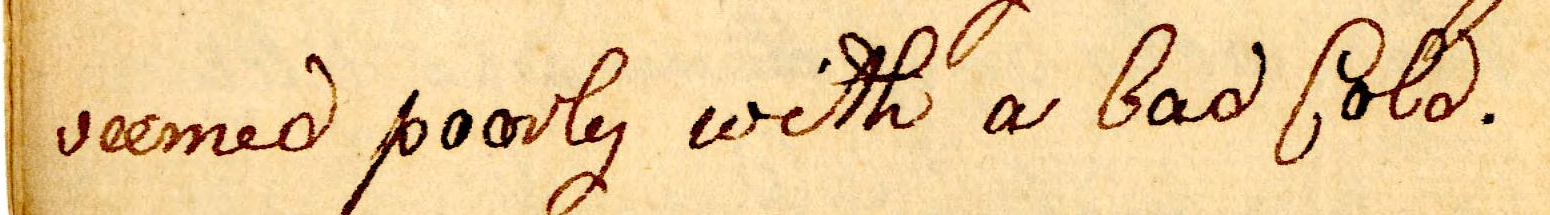seemed poorly with a bad Cold.
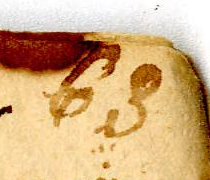63
